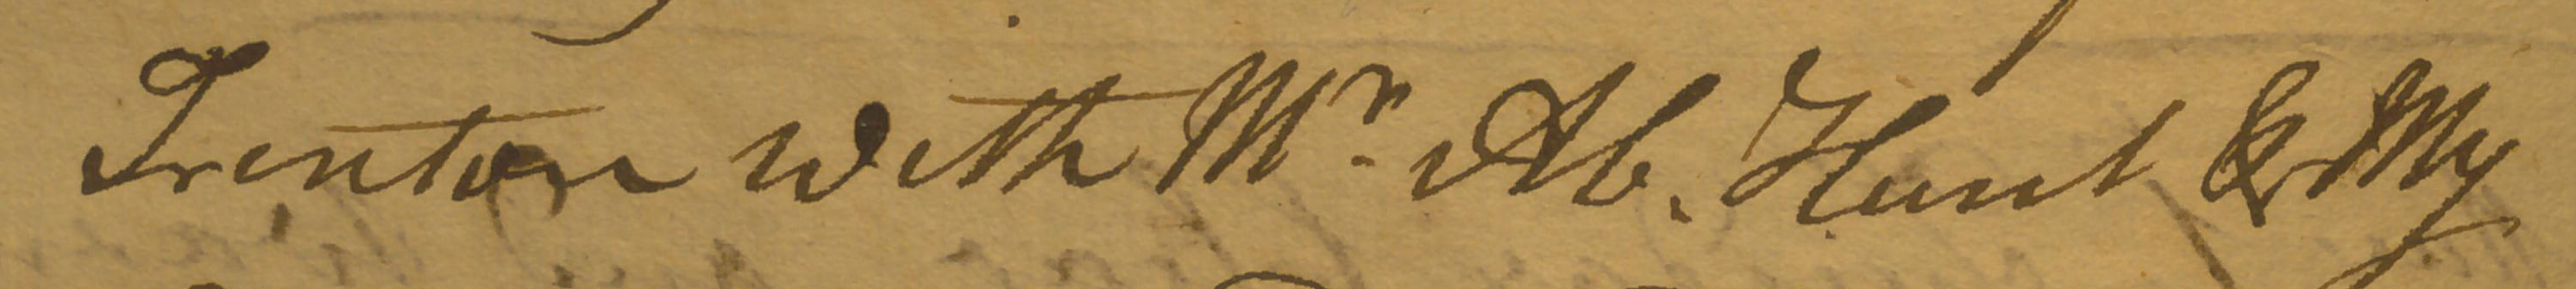Trenton with M^r. Ab. Hunt & My
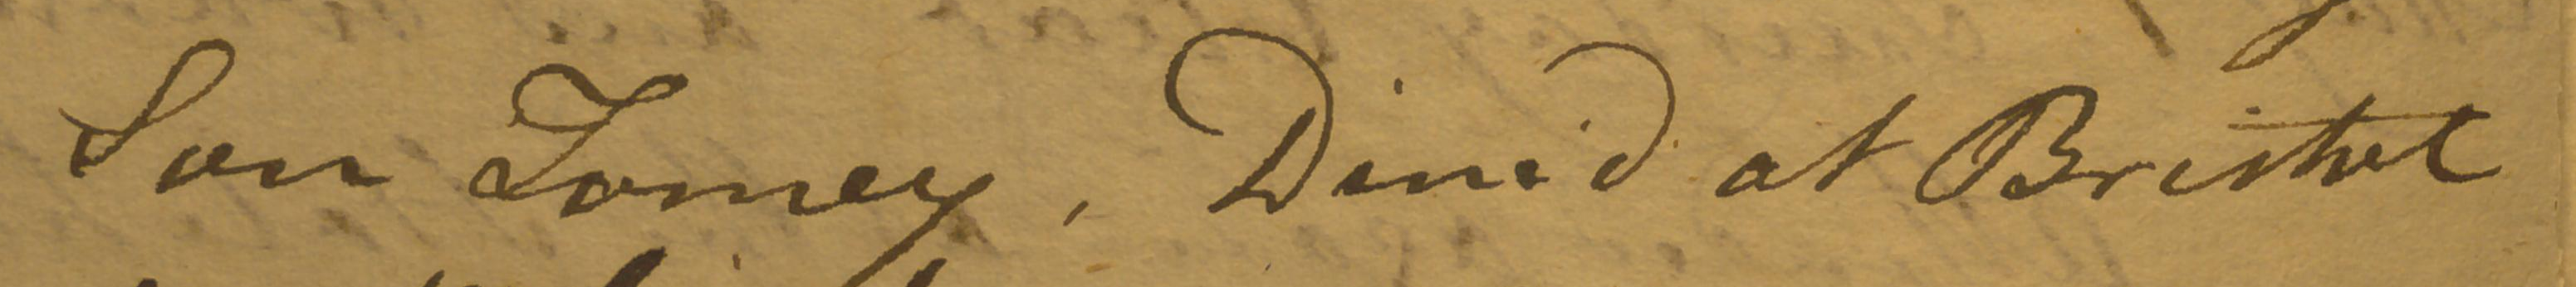Son Tomey, Dined at Brishel
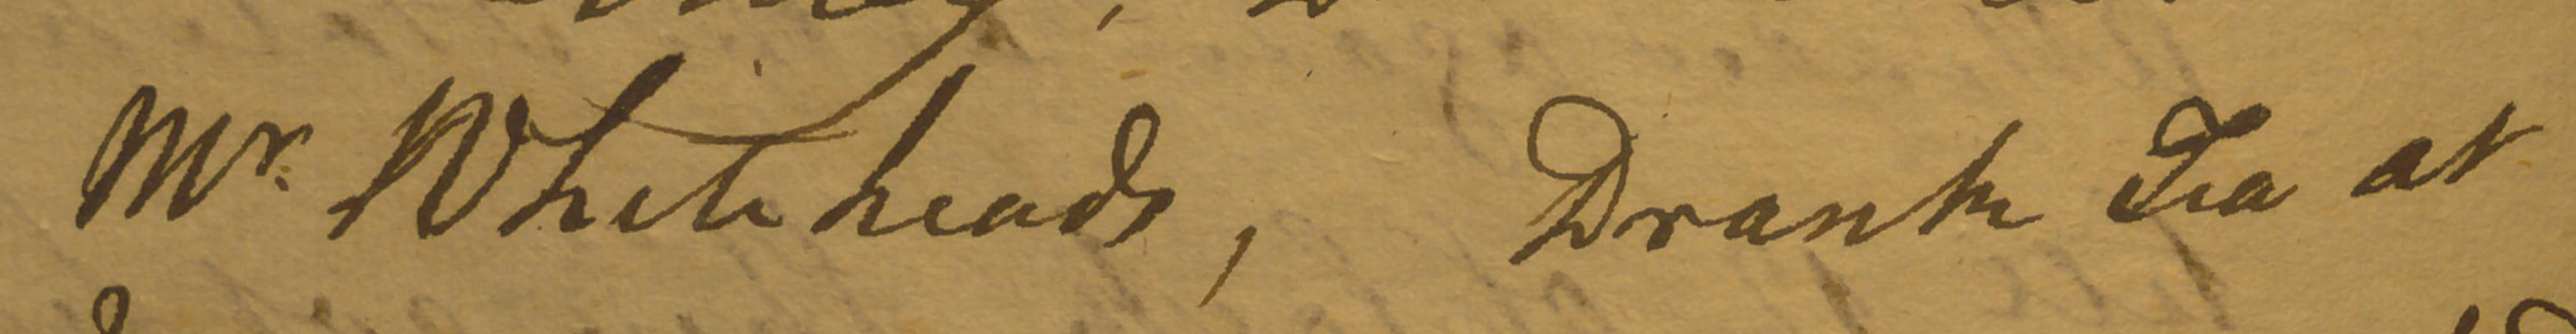M^r. Whiteheads, Drank Tea at
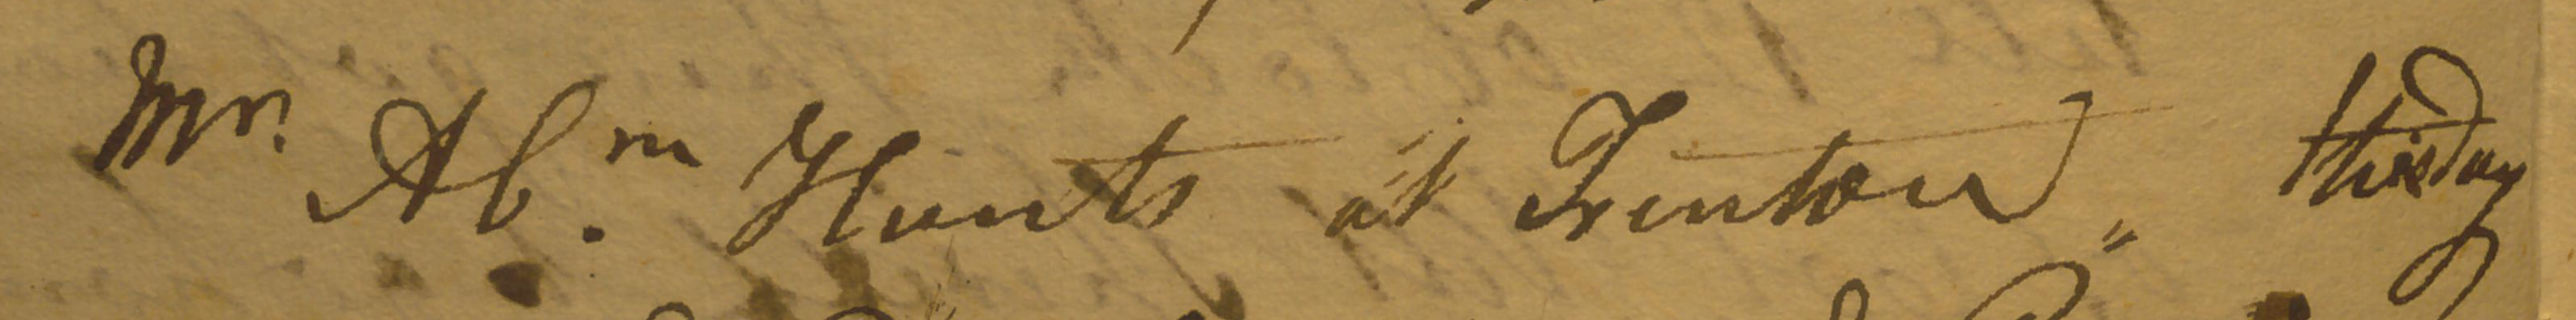M^r. Ab^m. Hunts at Trenton tjos day
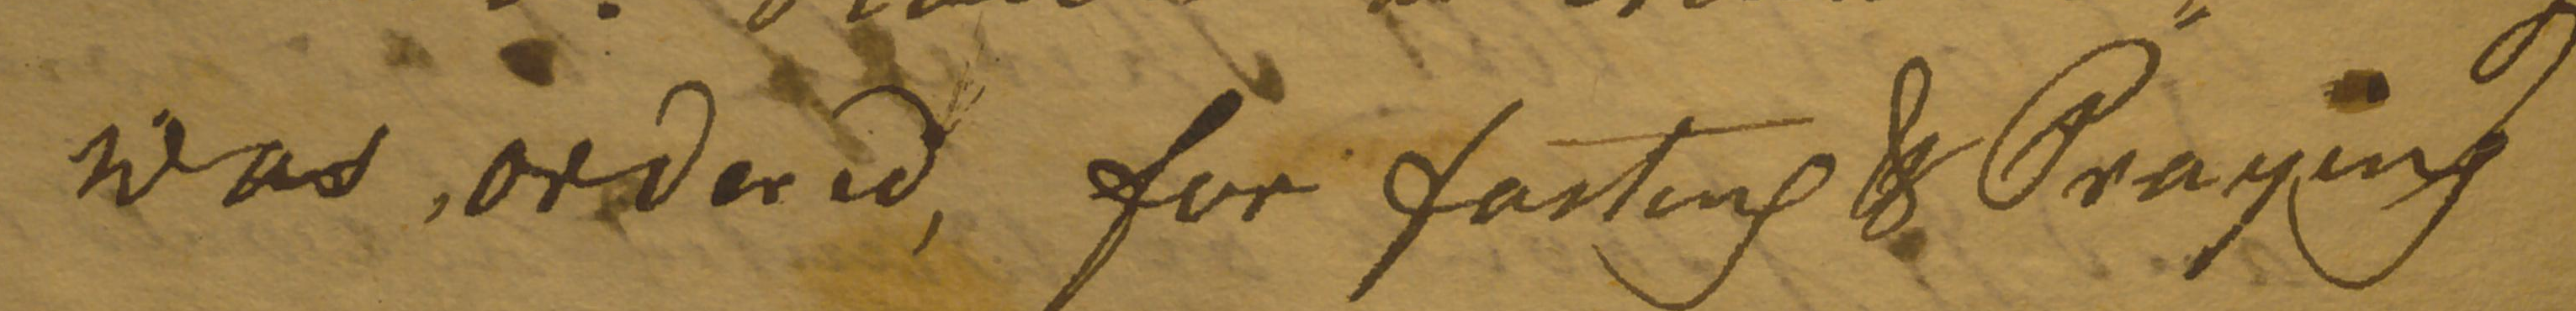was ordered, for fasting & Praying
